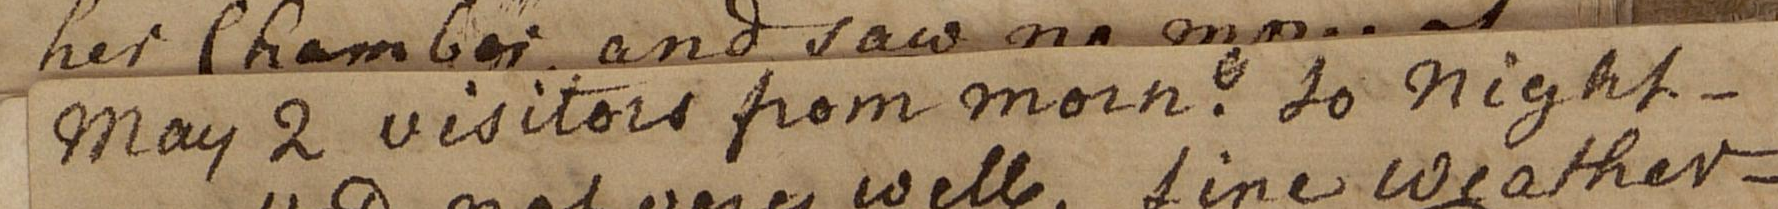May 2 visitors from morn^g. to Night.-
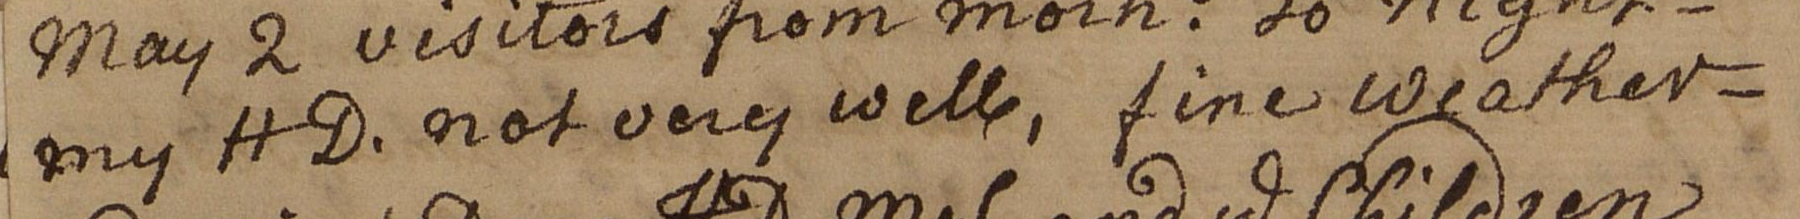my HD. not very well, fine weather-
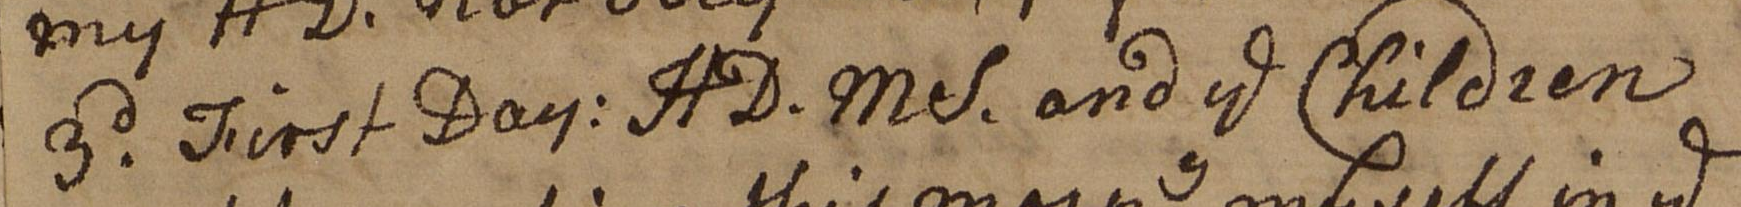3^d. First Day: HD. MS. and y^e Children
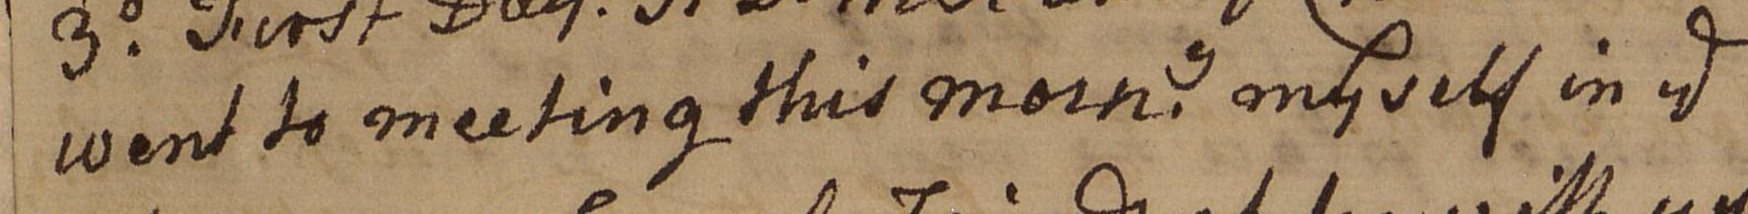went to meeting this morn^g. myself in y^e
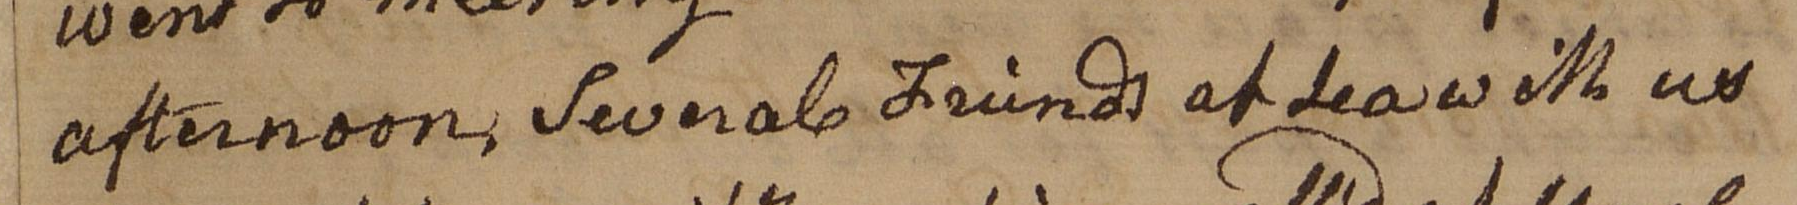afternoon, Several Friends at tea with us
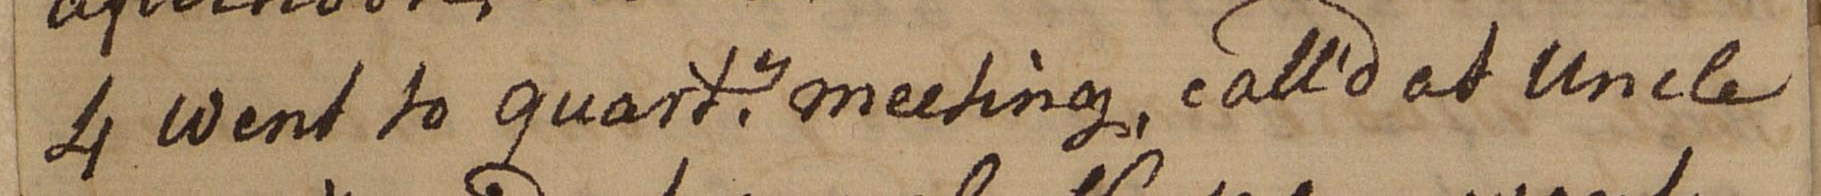4 went to quart^y. meeting, call'd at Uncle
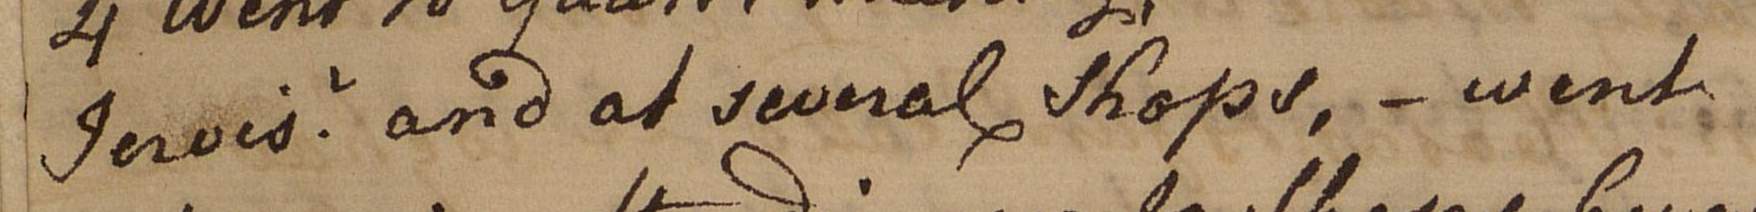Jervis^s. and at several shops,- went
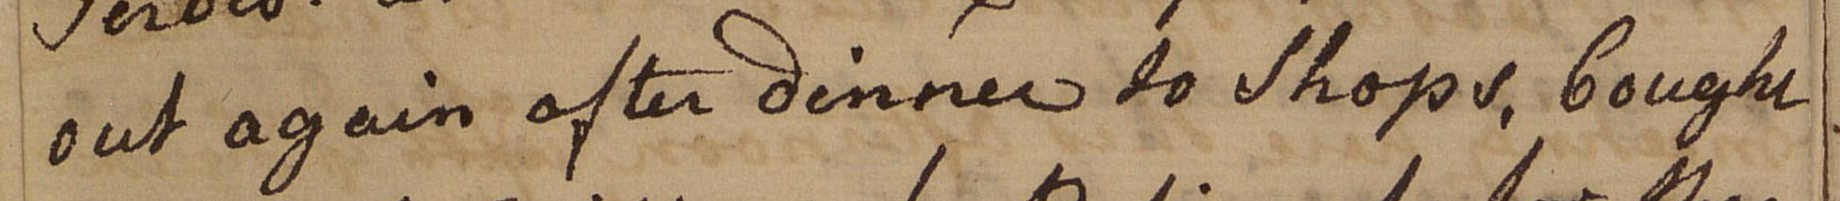out again after dinner to Shops, bought
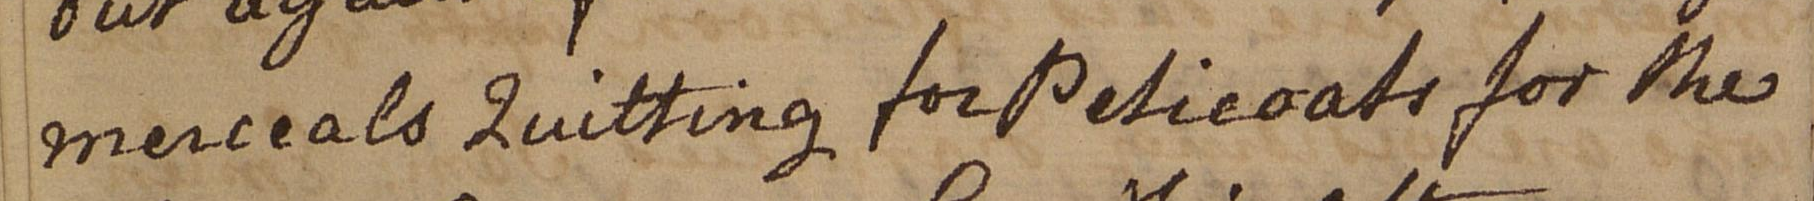merceals Quitting for Peticoats for the
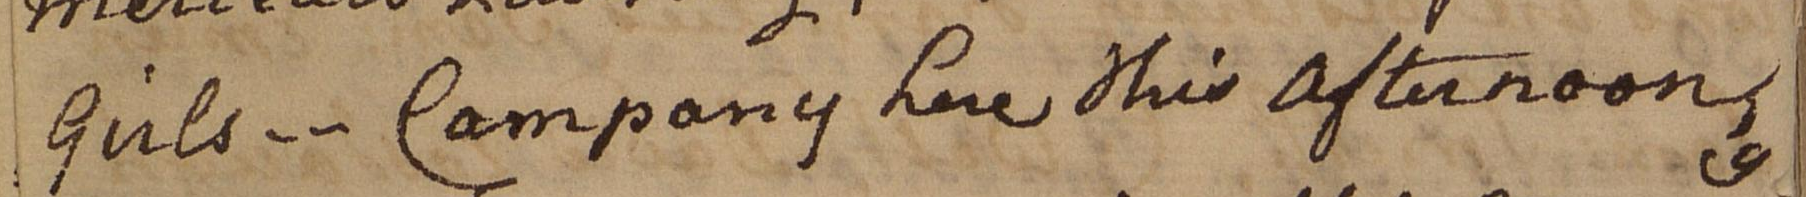Girls- Campany here this afternoon,
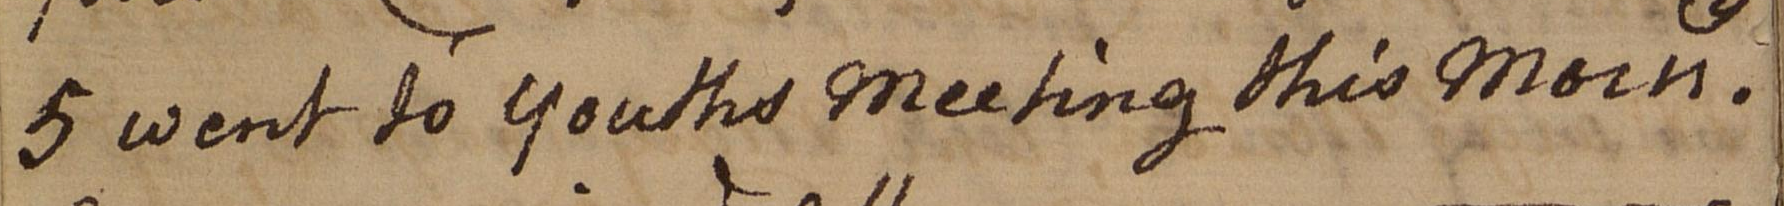5 went to youths meeting this Morn^g.
